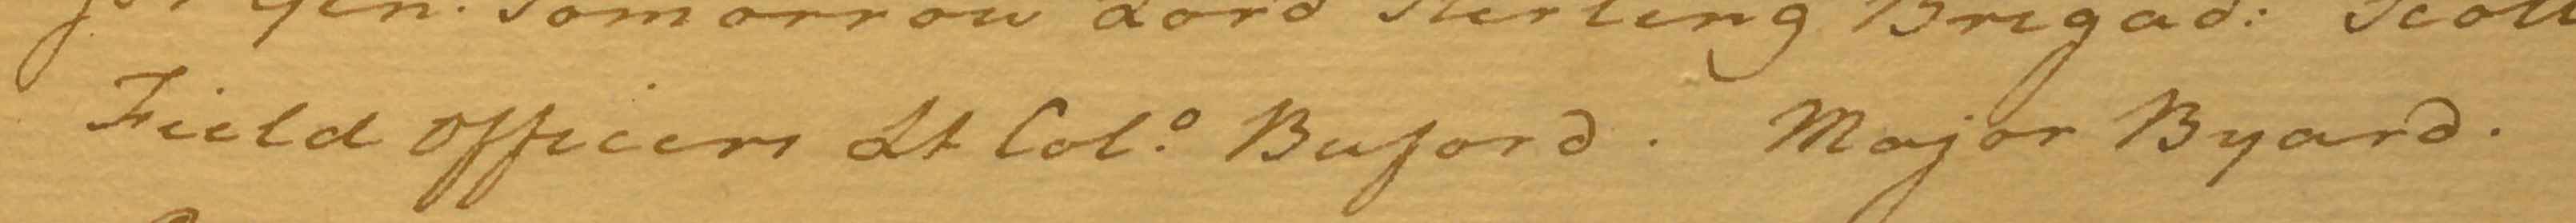Field officers Lt Col^o. Buford. Major Byard.
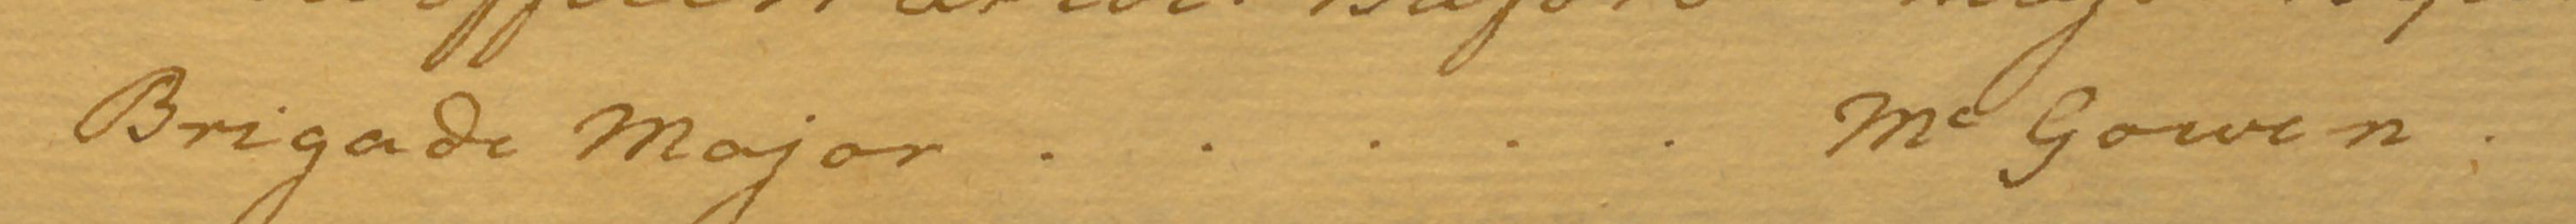Brigade Major. .... M^cGowen.
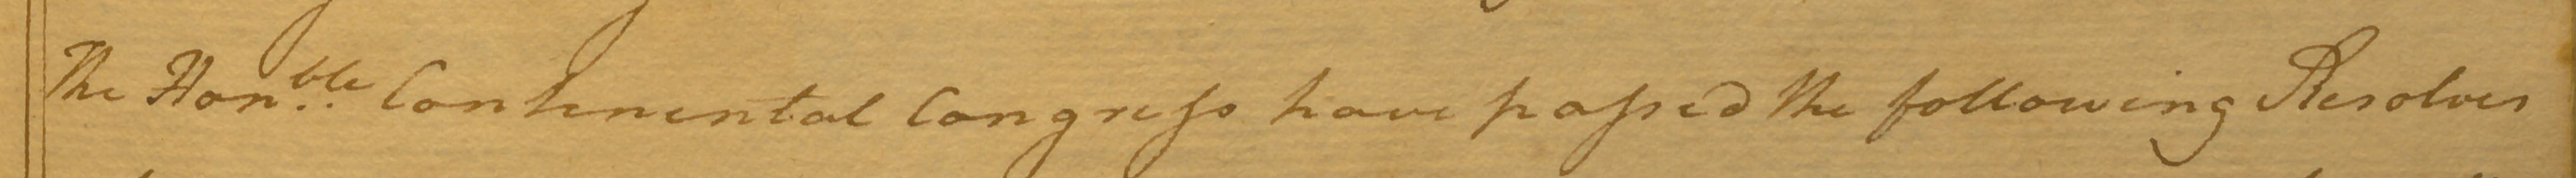The Hon^ble. Continental Congress have passed the following Resolves
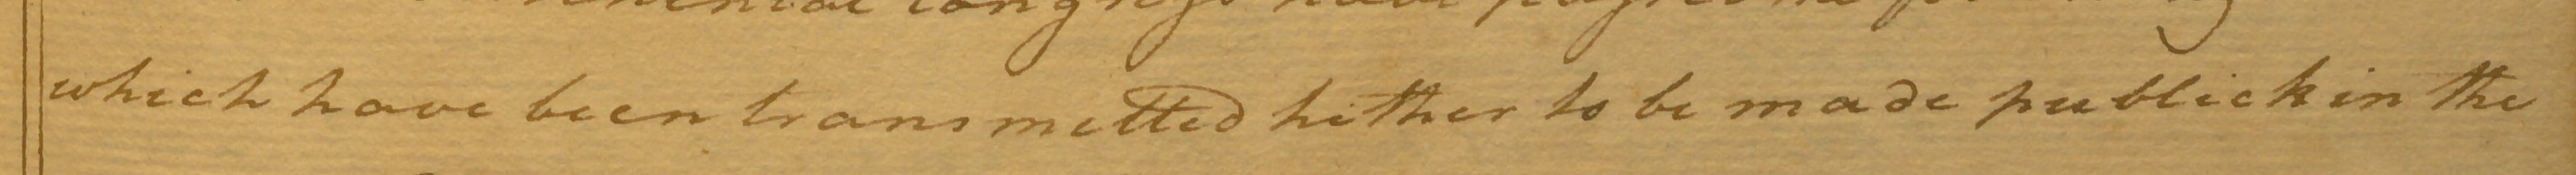which have been transmitted hither to be made publick in the
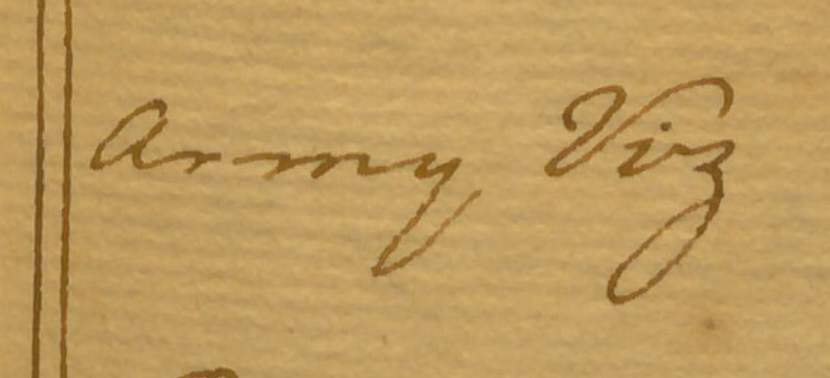Army Viz
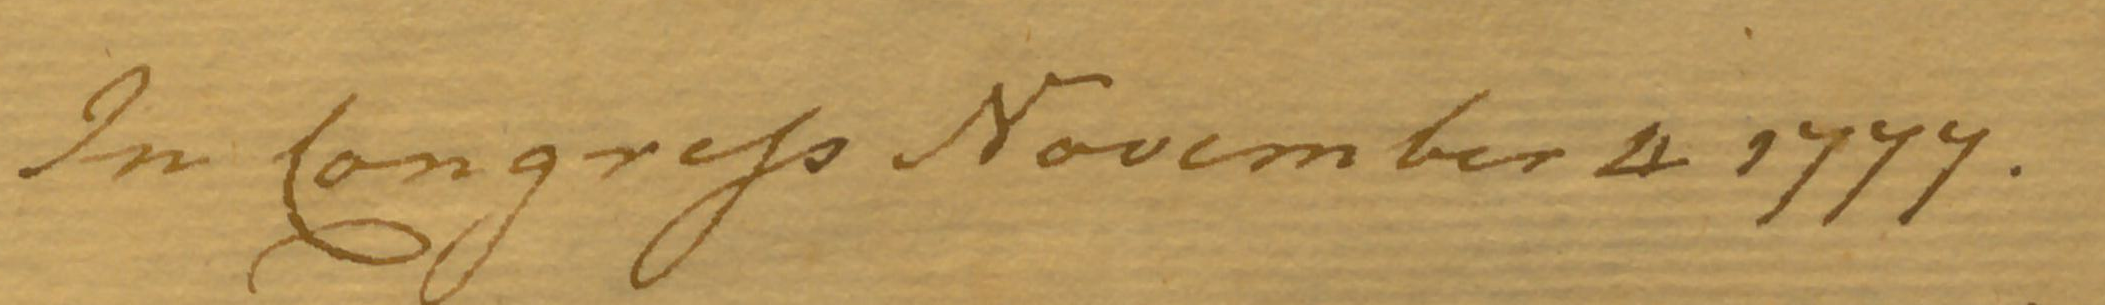In Congress November 4 1777.
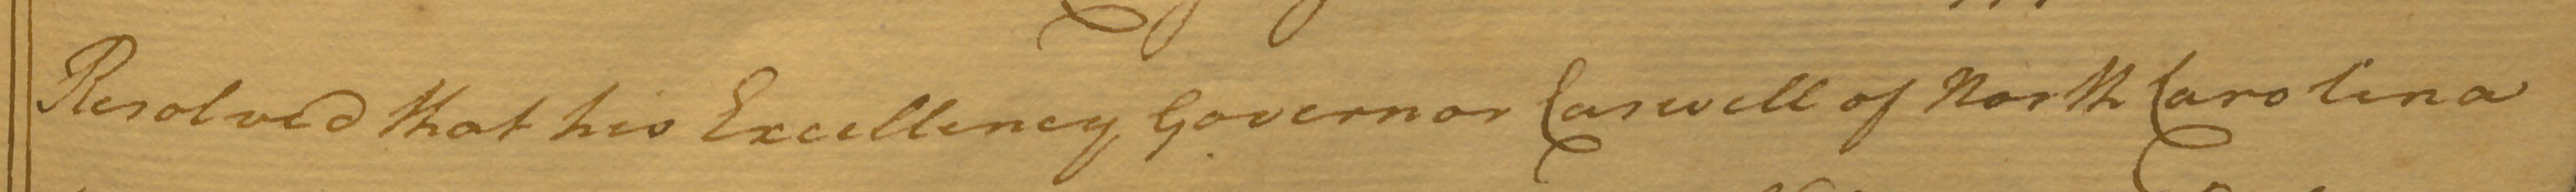Resolved that his Excellency Governor Caswell of North Carolina
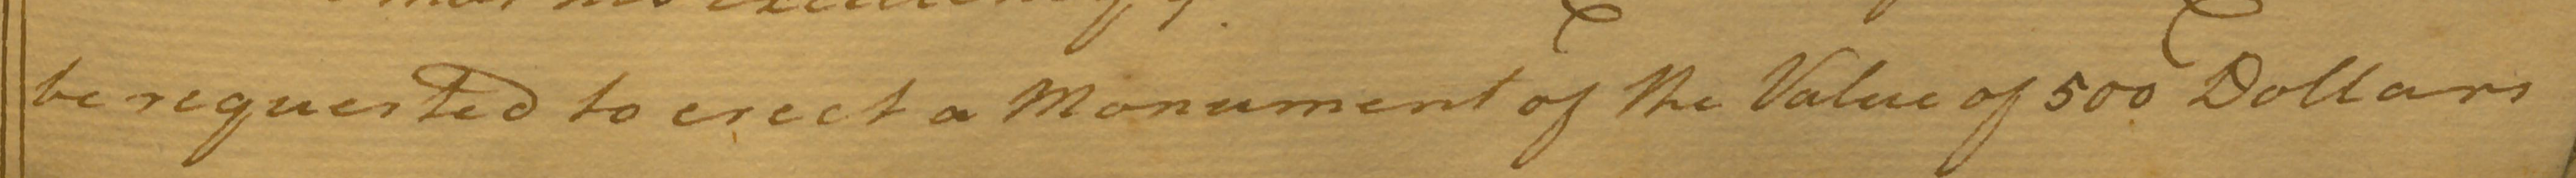be requested to erect a Monument of the Value of 500 Dollars
